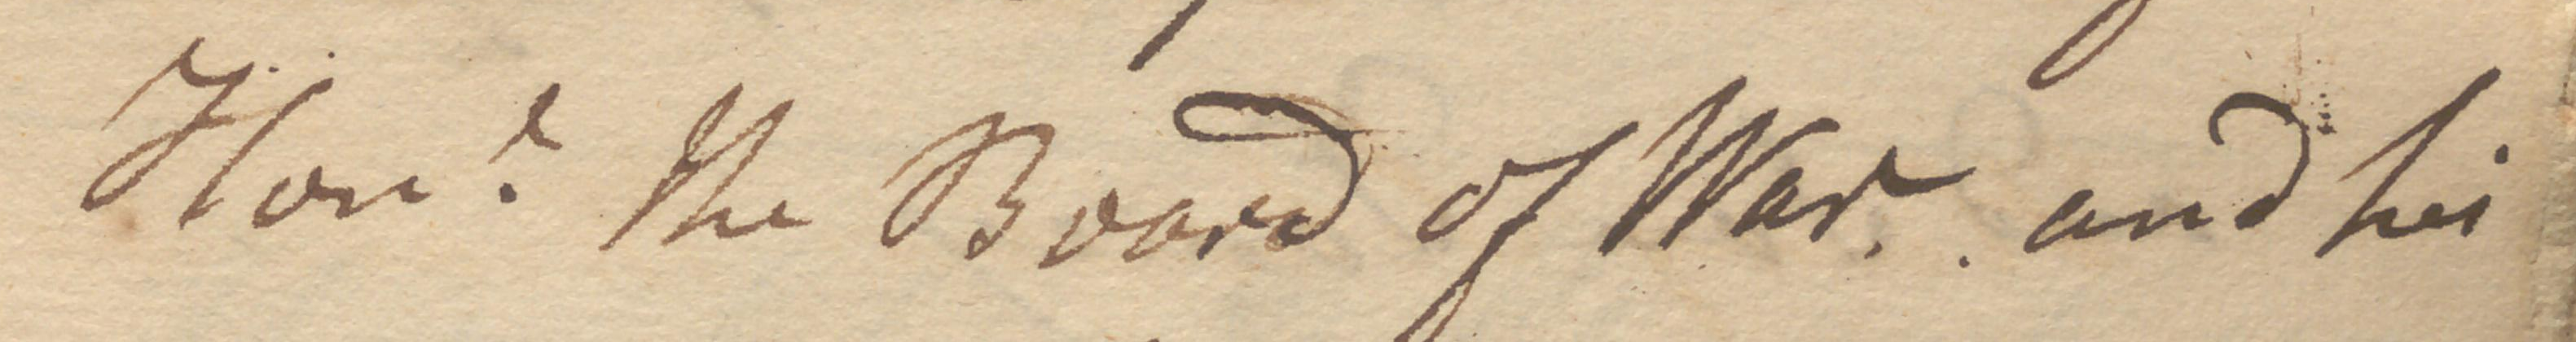Hon^l. The Board of War and his
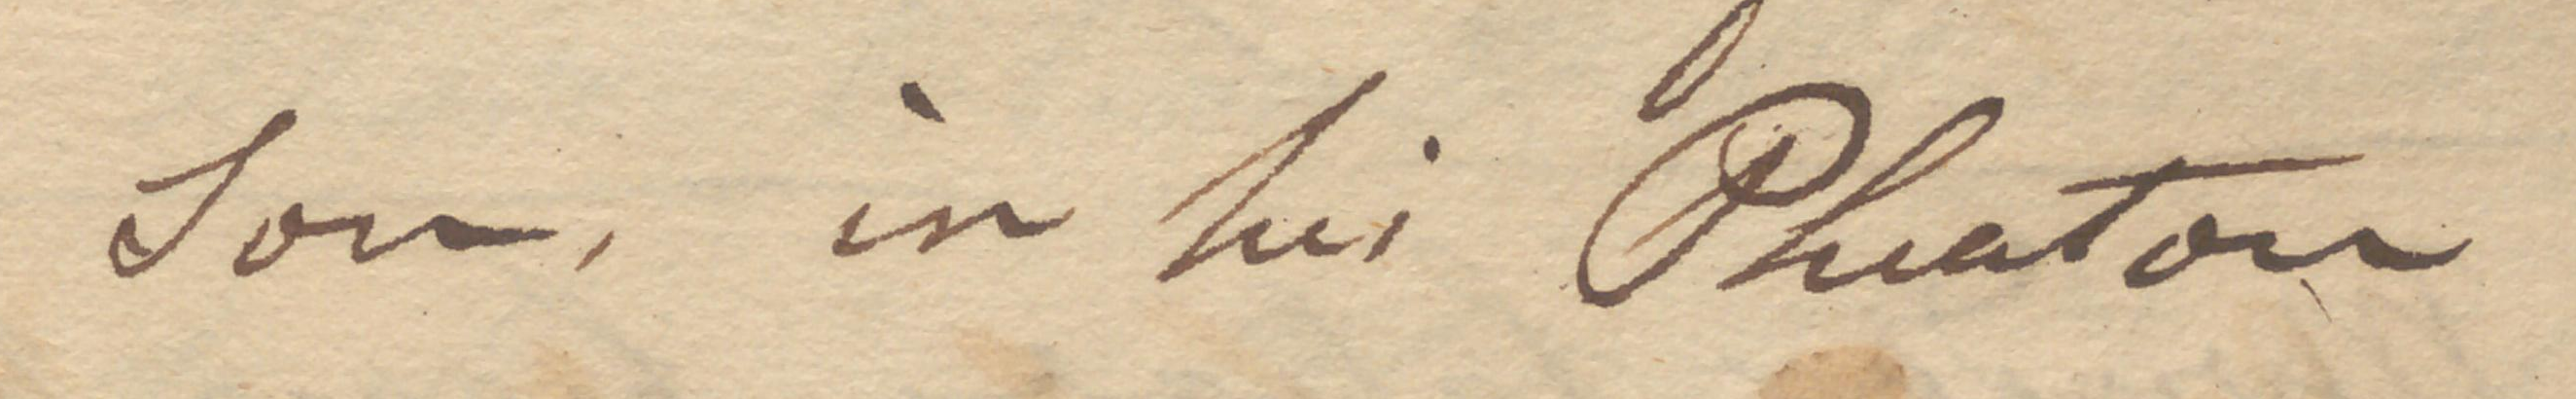son, in his Pheaton
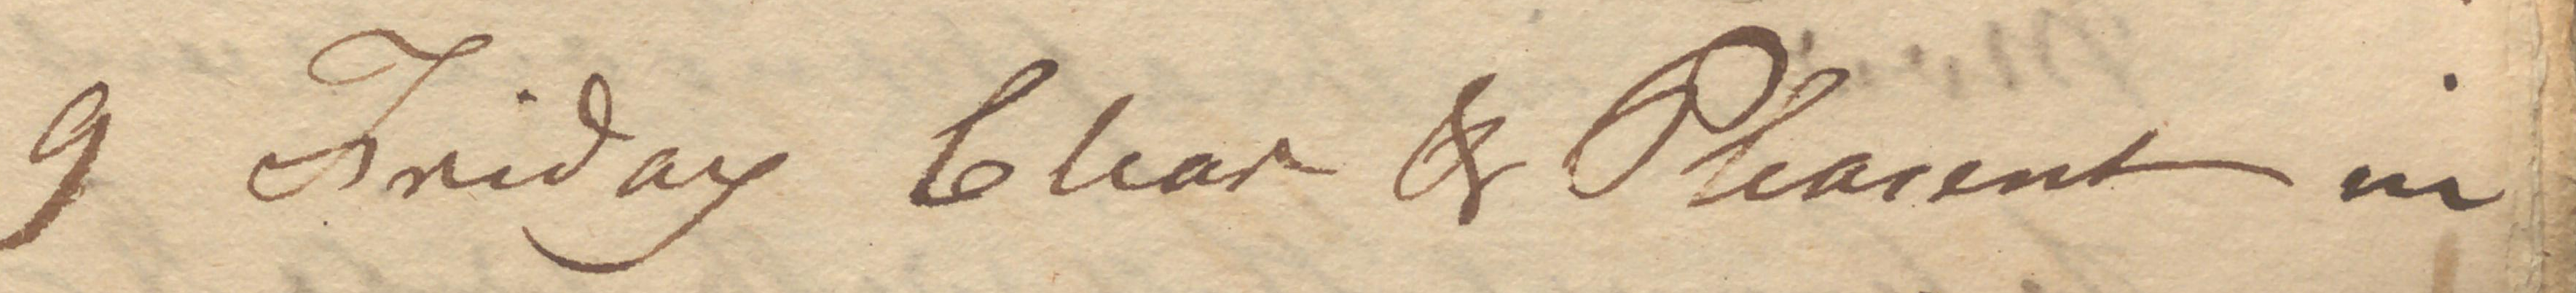9 Friday Clear & Pleasent in
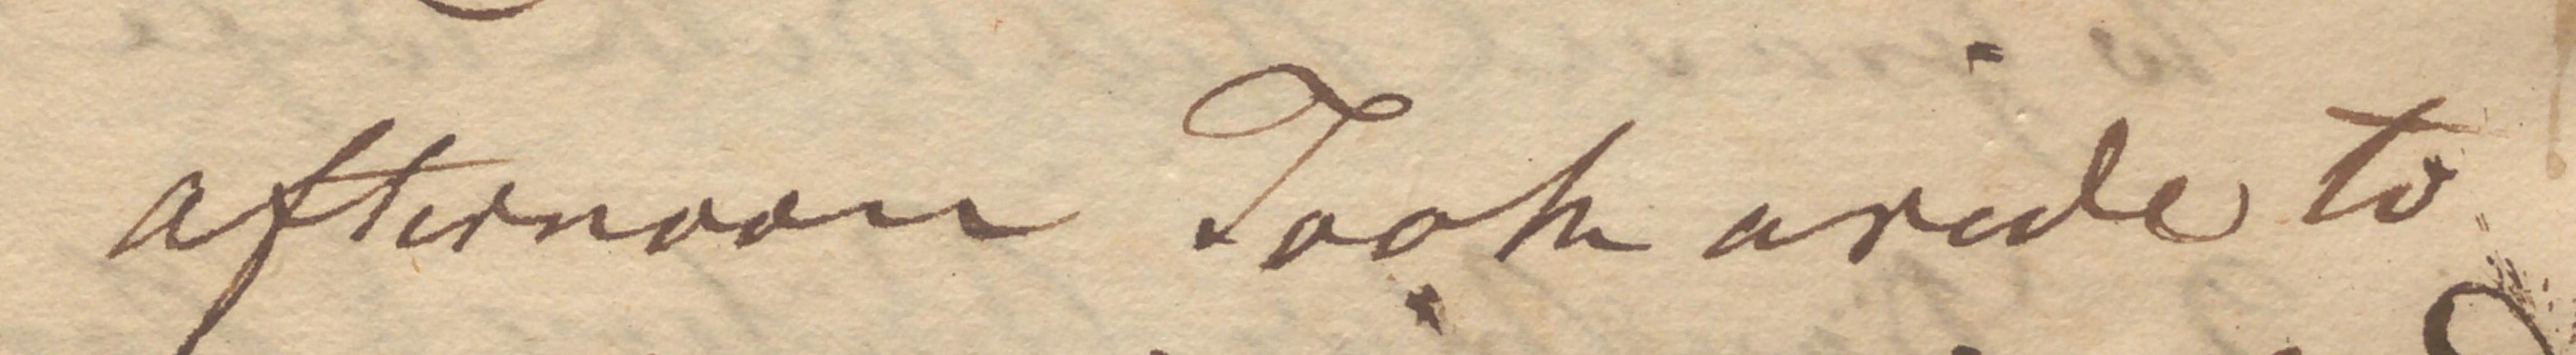afternoon Took a ride to
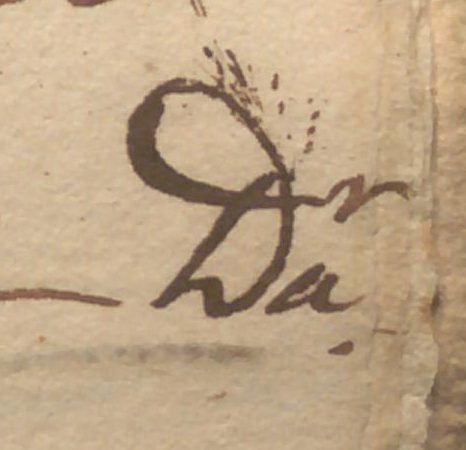Sa
